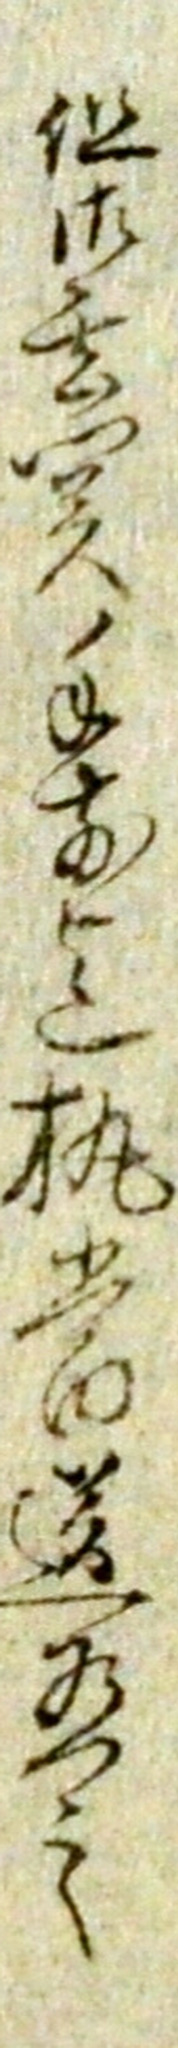但御玄関手前迄執當送有之
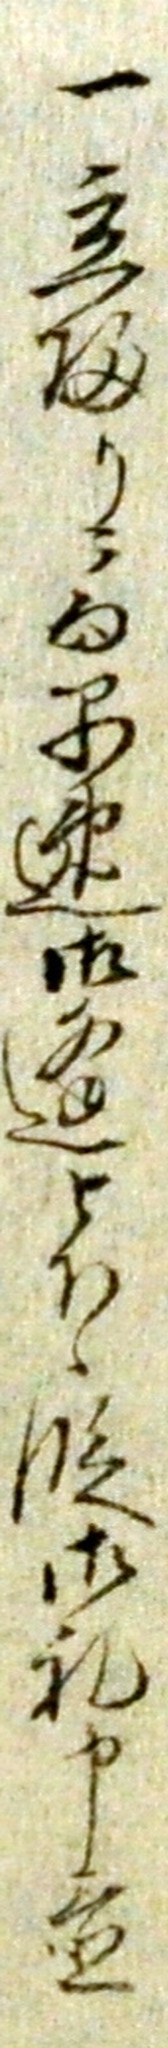一立帰りニ而早速御邊ヒ下候段御礼申置
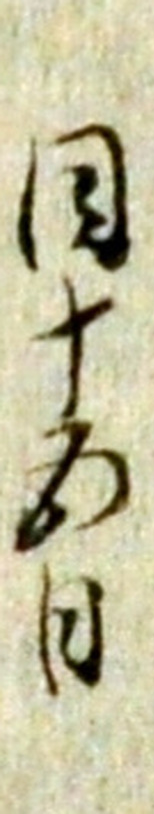同十五日
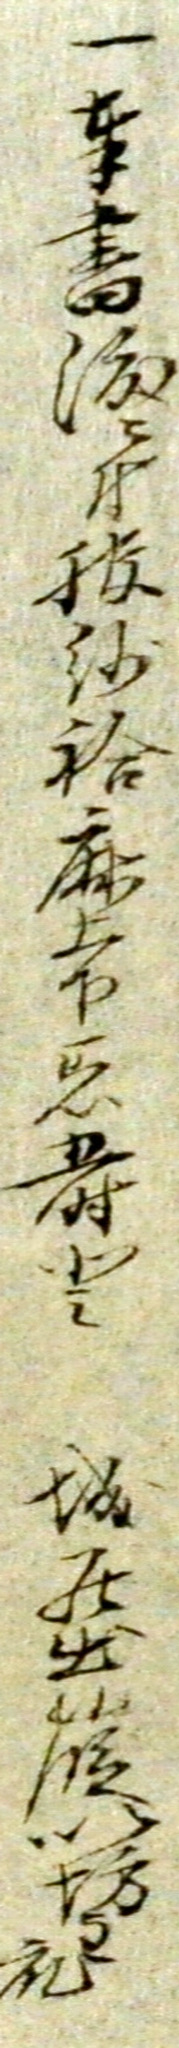一奉書渡ニ付服紗袷麻上下着五時登城罷出候段以坊主衆
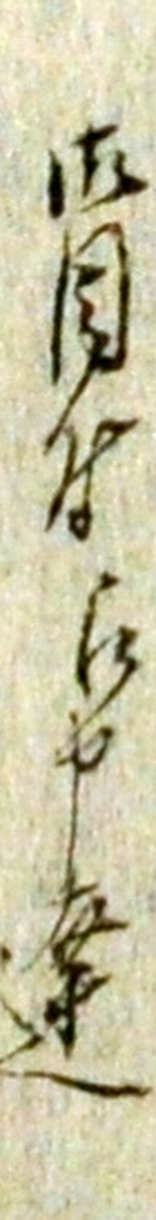御目付江申達
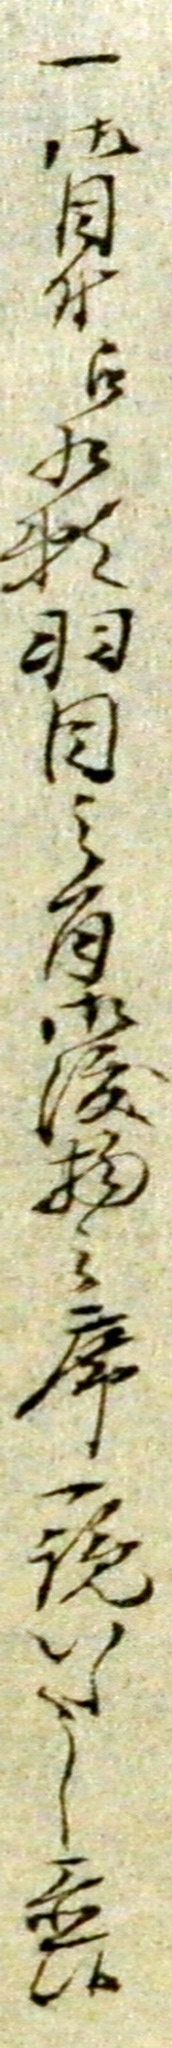一御目付江相頼羽目間御渡物之席一覧いたし置候
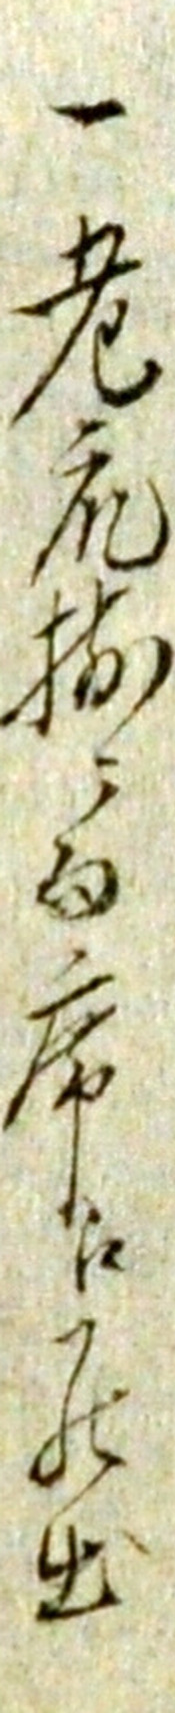一老衆揃ニ而席江罷出
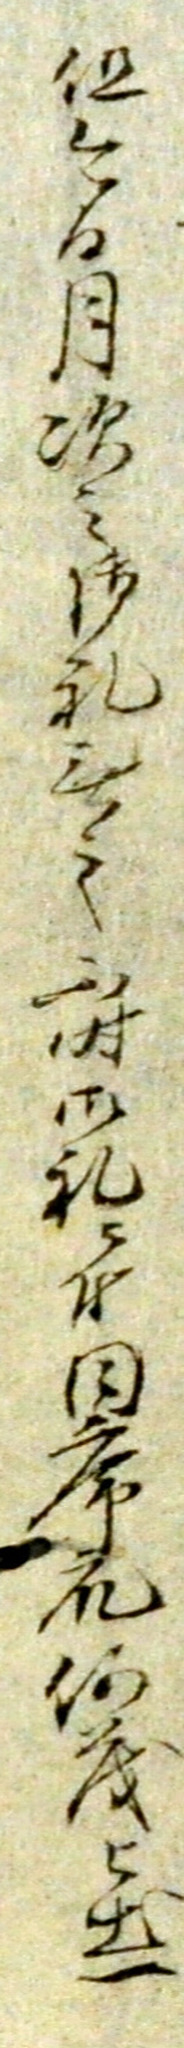但今日月次之御礼無之不時御礼ニ付同席衆何茂ヒ出
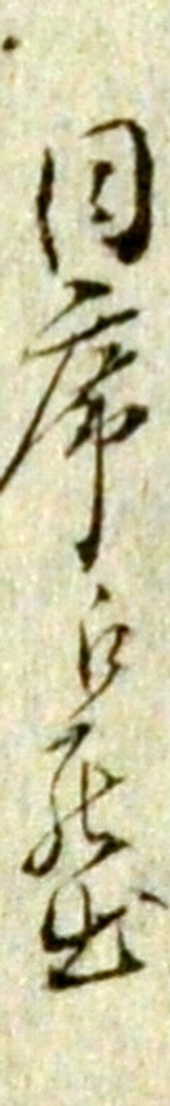同席江罷出
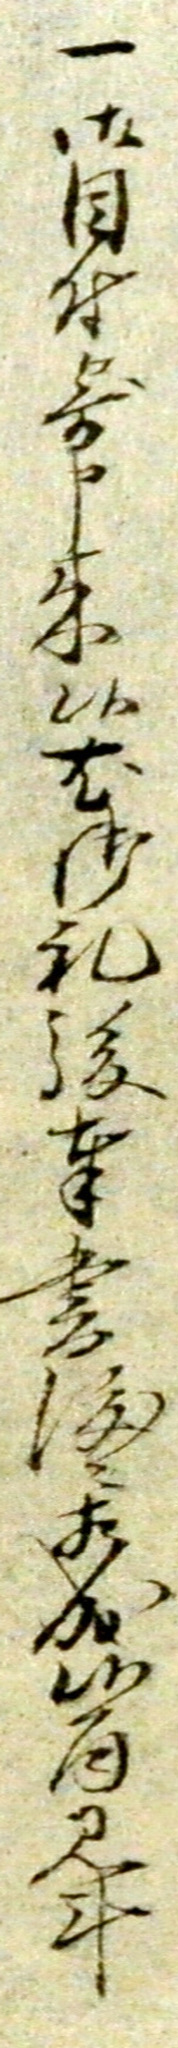一御目付寄申来候尤御礼後奉書渡相成候間見計
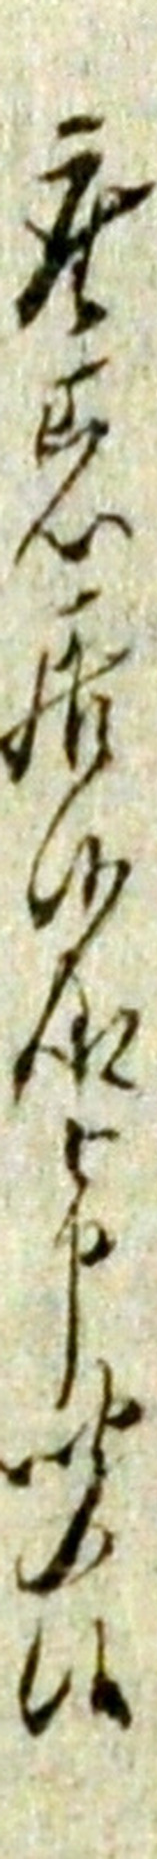座着居候処ヒ申聞候
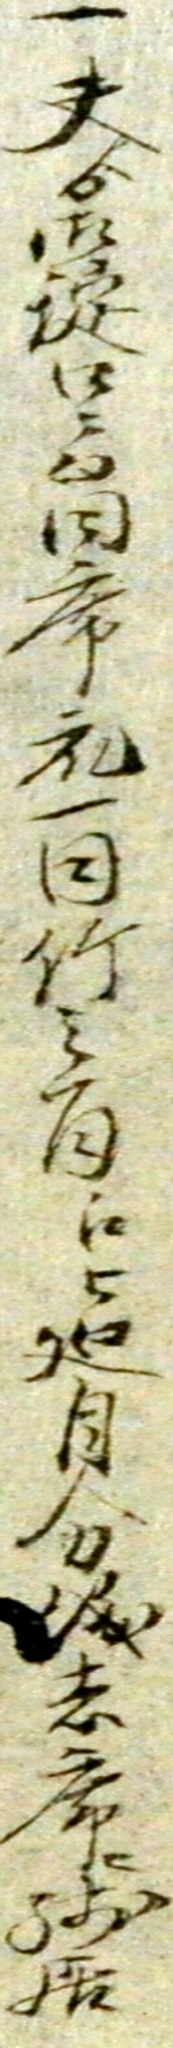一夫ゟ御錠口ニ而同席衆一同竹間江ヒ廻自分儀者席江残居
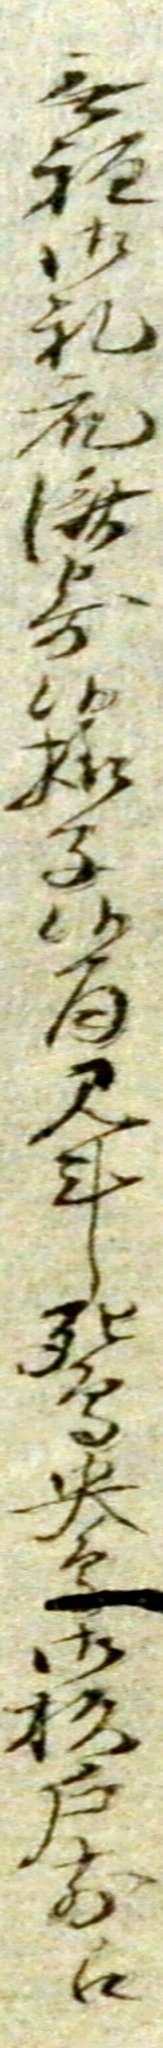無程御礼衆済寄候様子候間見計鴛鴦御杉戸前江
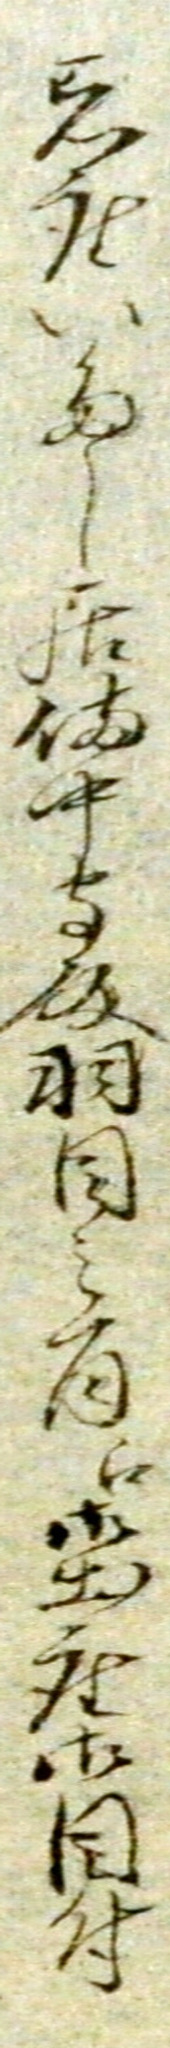着座い多し居備中守殿羽目之間江御出座御目付
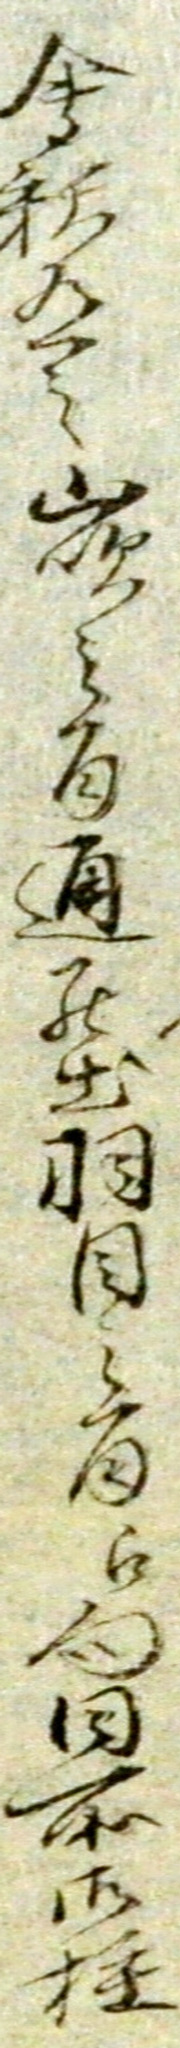会釈有之山吹之間通罷出羽目之間江向同所御
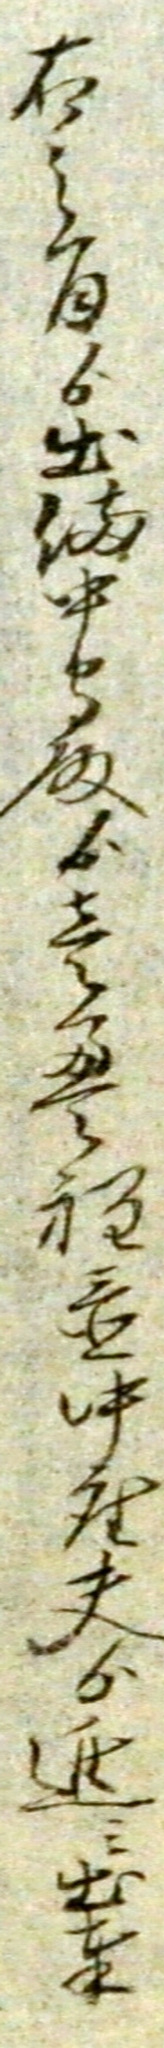右之間ゟ出備中守殿ゟ壱畳程置中座夫ゟ進ミ出奉
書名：日光御名代相勤候節ノ留
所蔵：伊那市立高遠町図書館・合同会社AMANE
